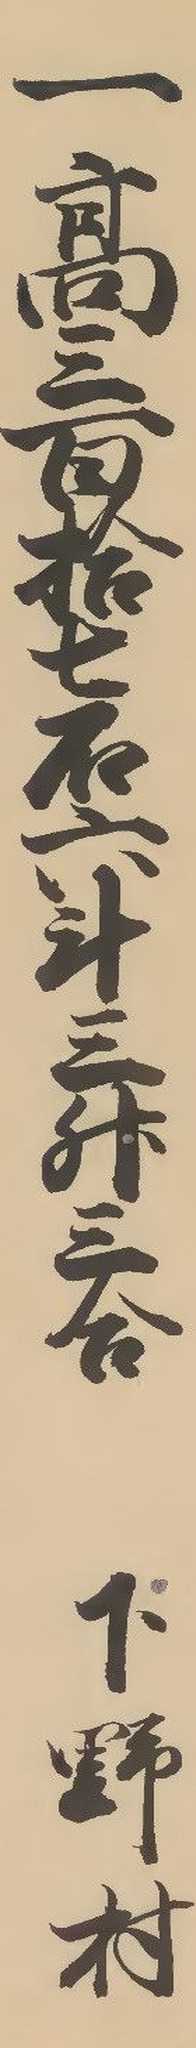一髙三百拾七石六斗三升三合下野村
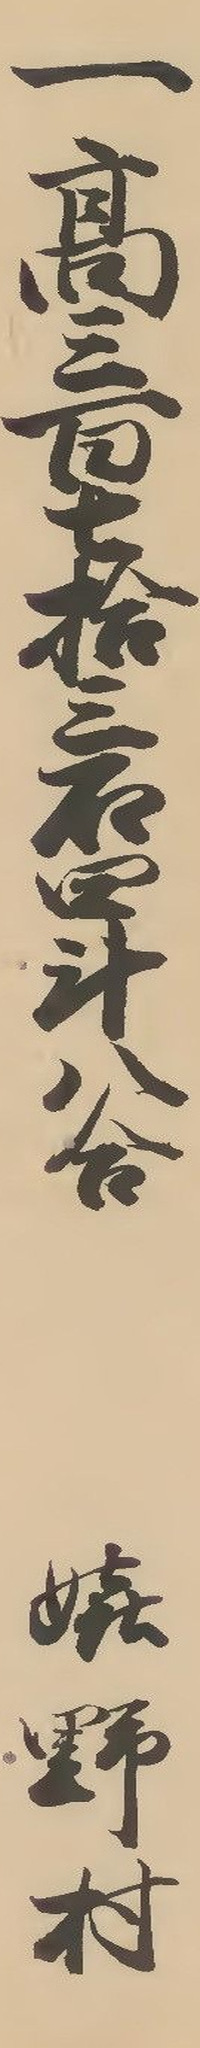一髙三百七拾三石四斗八合嬉野村
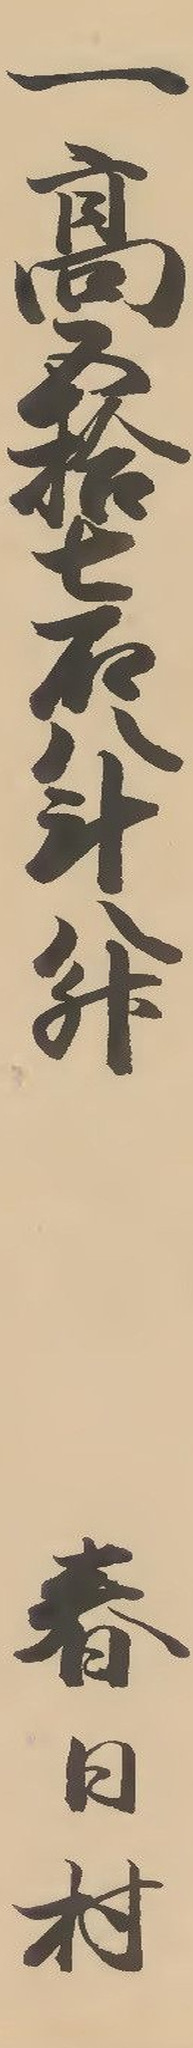一髙五拾七石八斗八升春日村
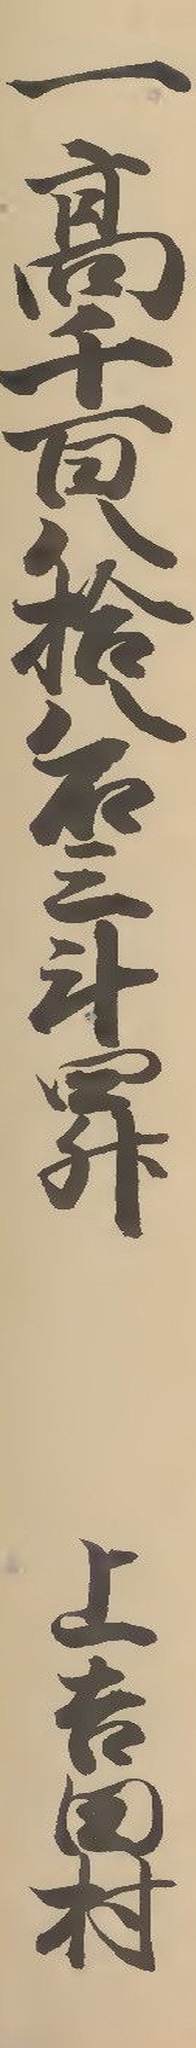一髙千百八拾八石三斗四升上吉田村
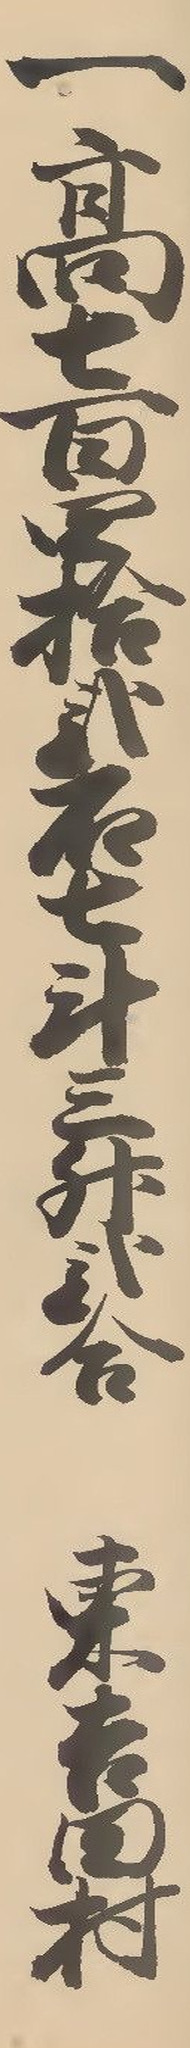一髙七百四拾弐石七斗三升弐合東吉田村
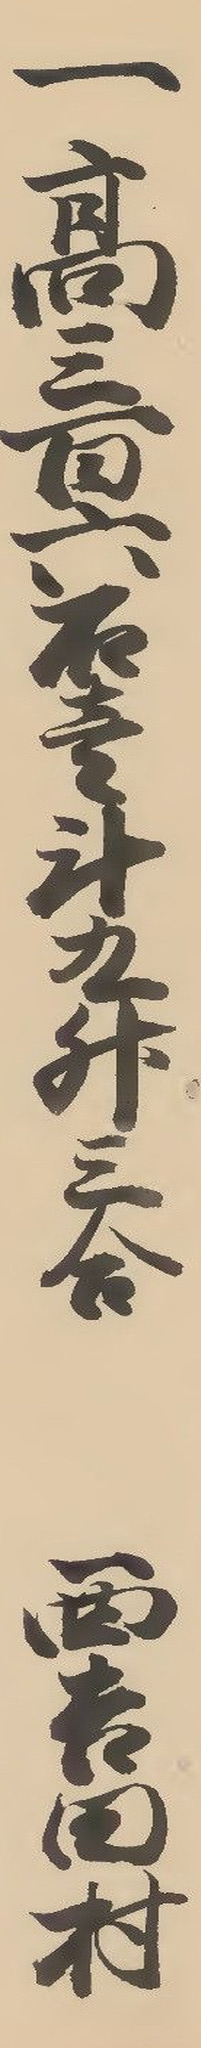一髙三百六石壱斗九升三合西吉田村
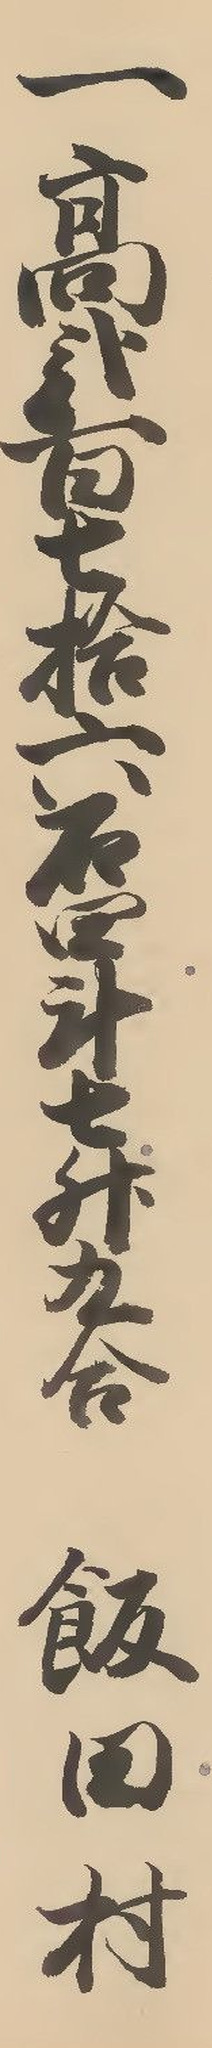一髙弐百七拾六石四斗七升九合飯田村
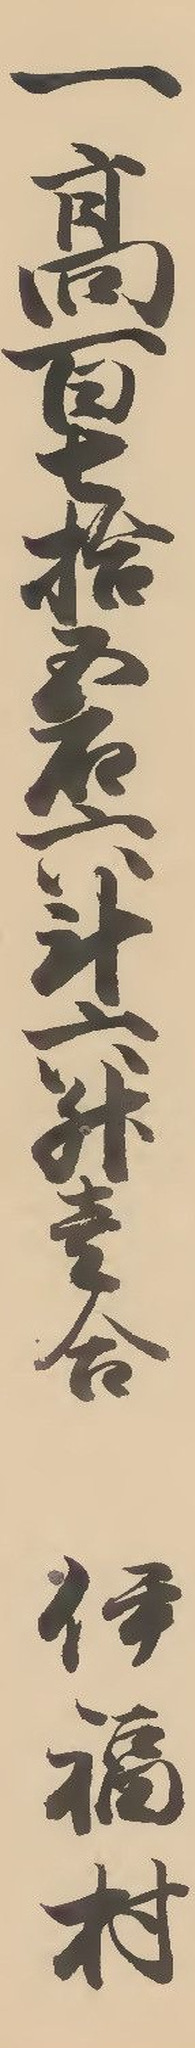一髙百七拾五石六斗六升壱合伊福村

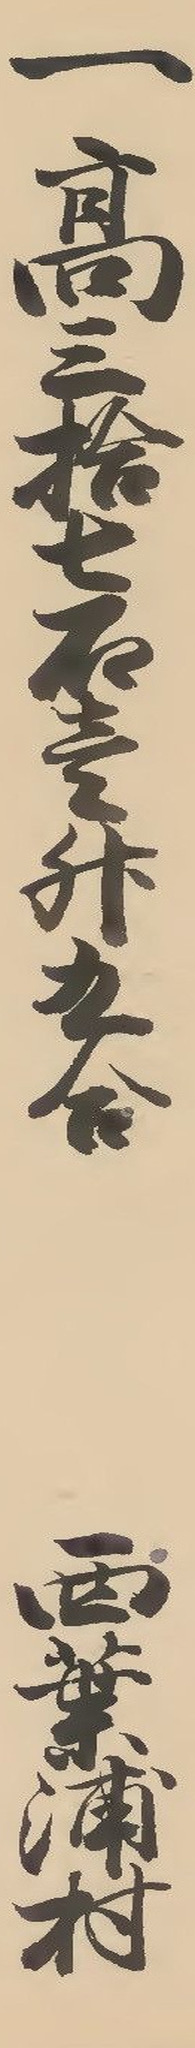一髙三拾七石壱升九合西葉浦村
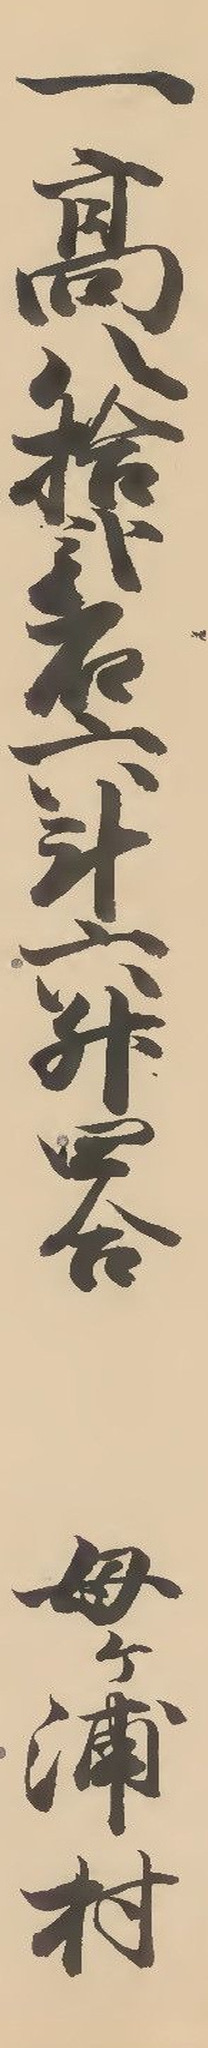一髙八拾弐石六斗六升四合母ケ浦村
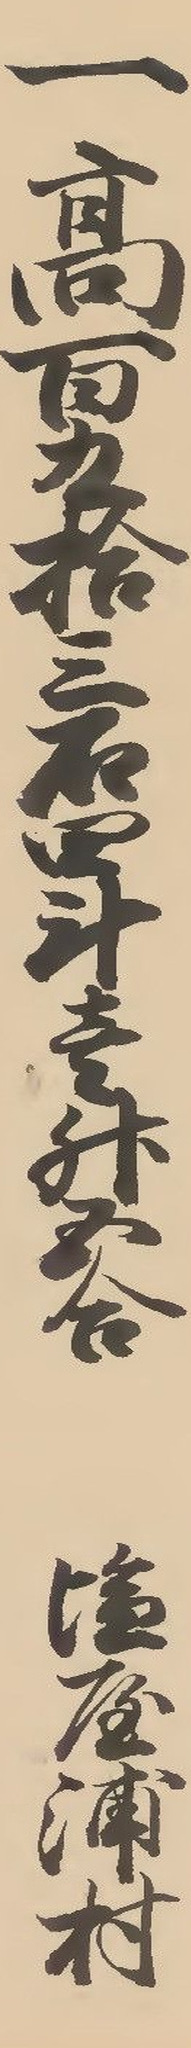一髙百九拾三石四斗壱升五合塩屋浦村
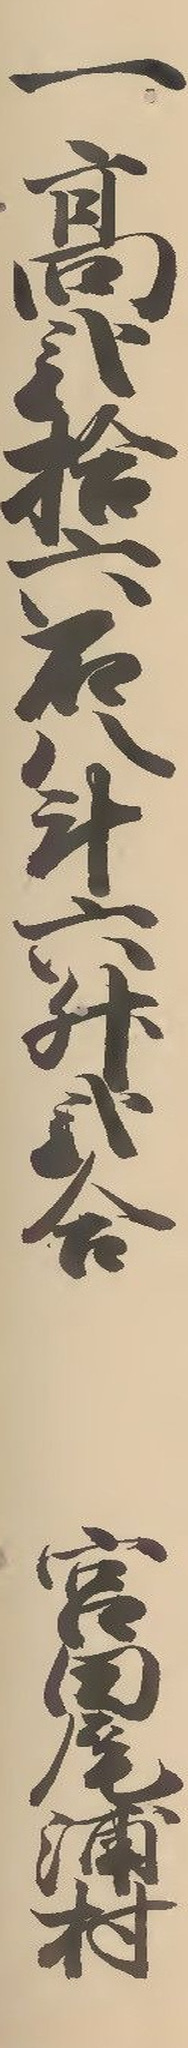一髙弐拾六石八斗六升弐合宮田尾浦村
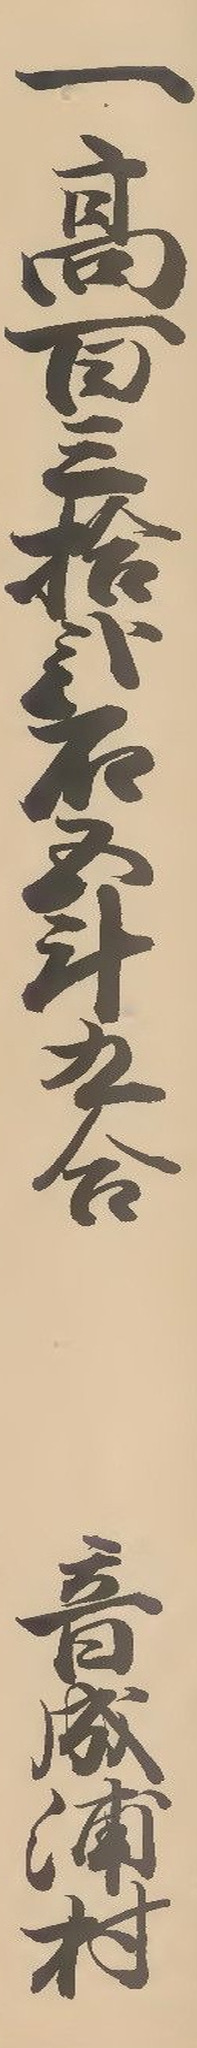一髙百三拾弐石五斗九合音成浦村
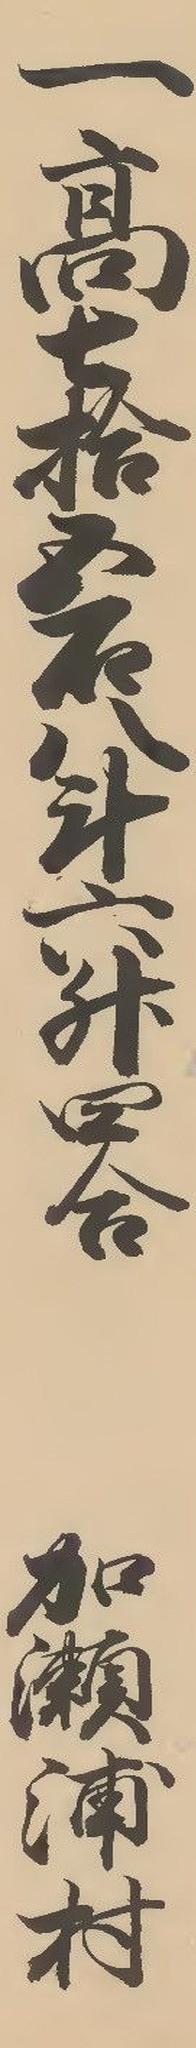一髙七拾五石八斗六升四合加瀬浦村
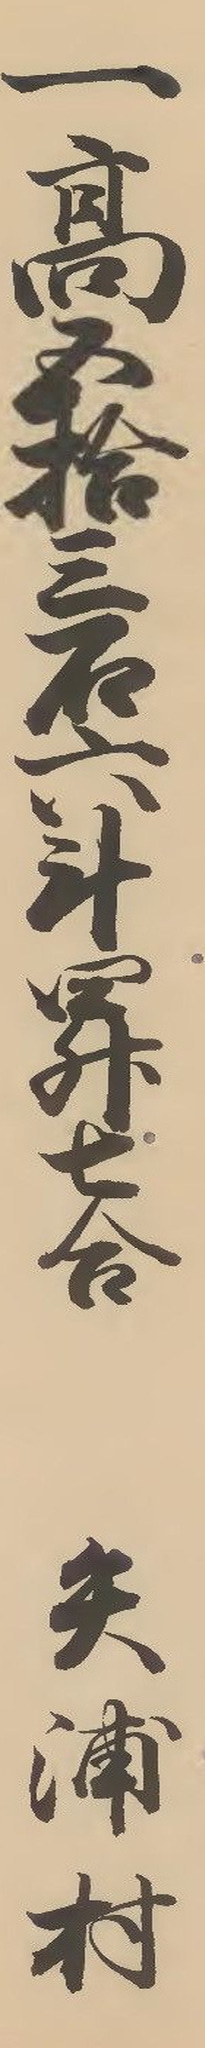一髙五拾三石六斗四升七合矢浦村
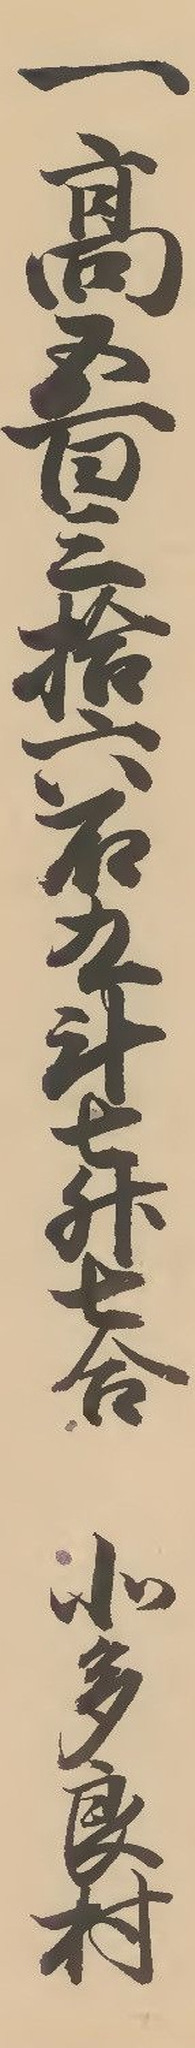一髙五百三拾六石九斗七升七合北多良村
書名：肥前国郷帳
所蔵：国立公文書館 National Archives of Japan
